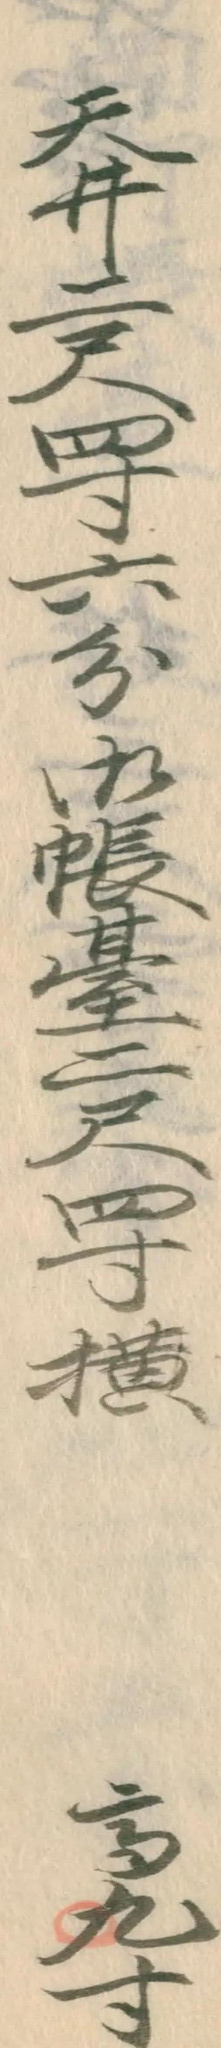天井二尺六寸御帳台二尺六寸横高九寸
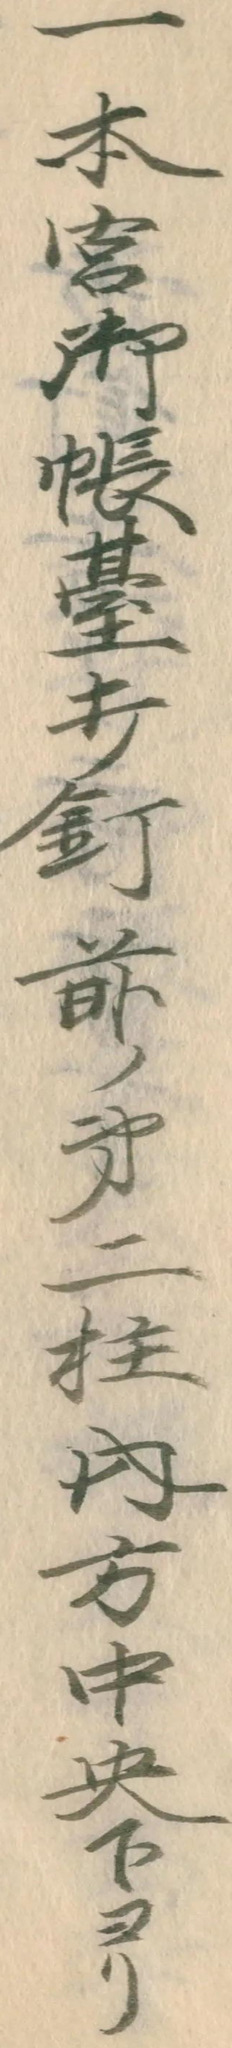一本宮御帳台打釘前ノ第二柱内方中央下ヨリ
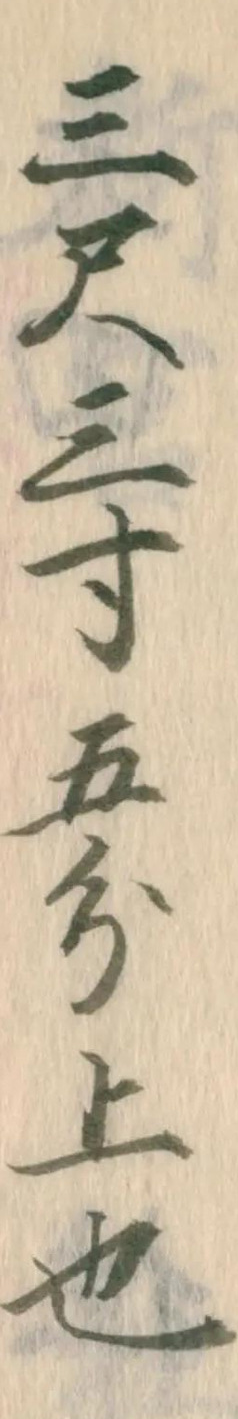三尺三寸五分上也

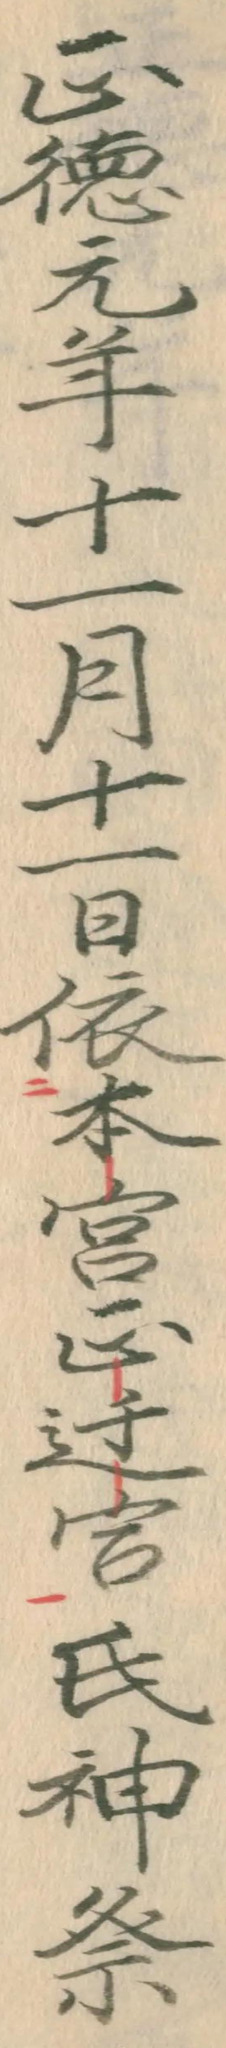正徳元年十一月十一日依本-宮正-迁-宮氏神祭
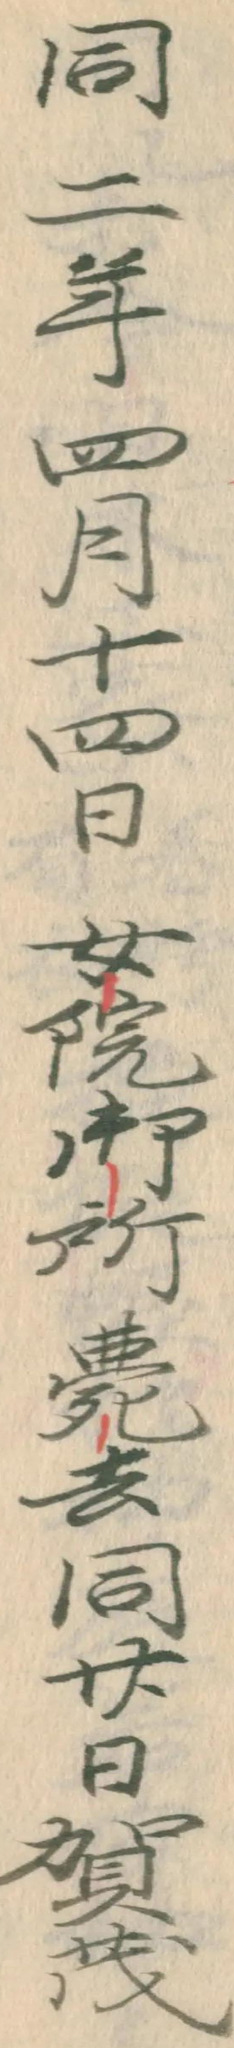同二年四月十四日女-院御-所薨-去同廿日賀茂
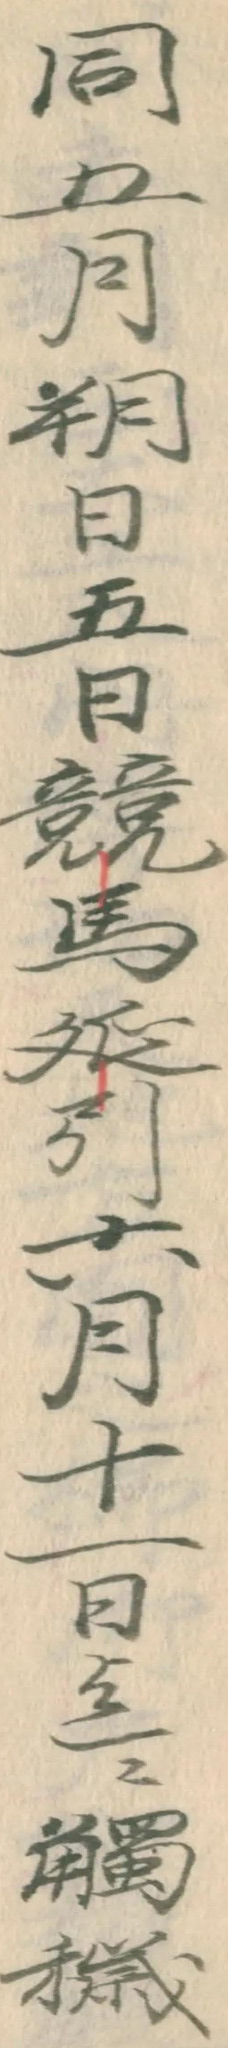同五月朔日五日競-馬延-引六月十一日迄ニ触穢
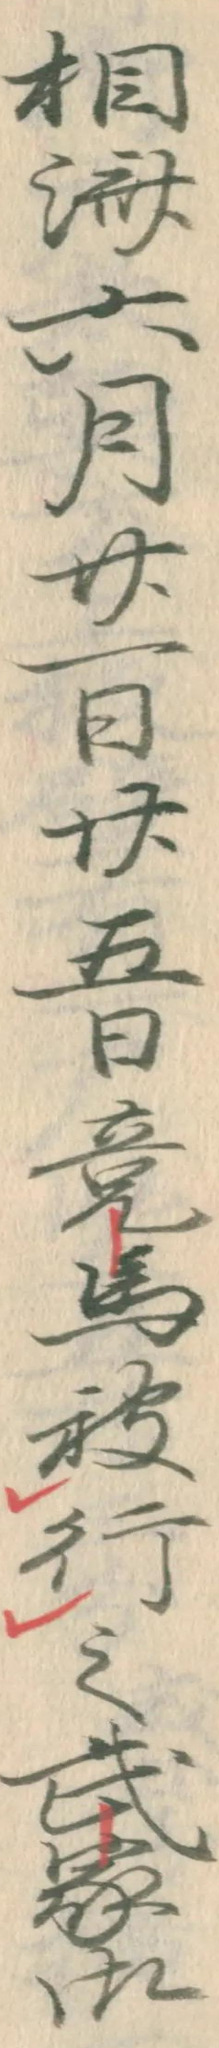相済六月廿一日廿五日競-馬被レ行レ之武-家御
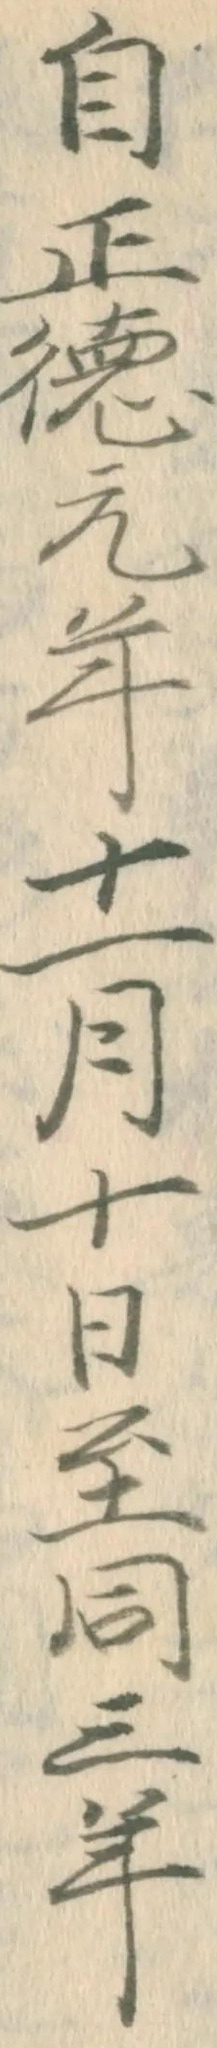自正徳元年十一月十日至同三年
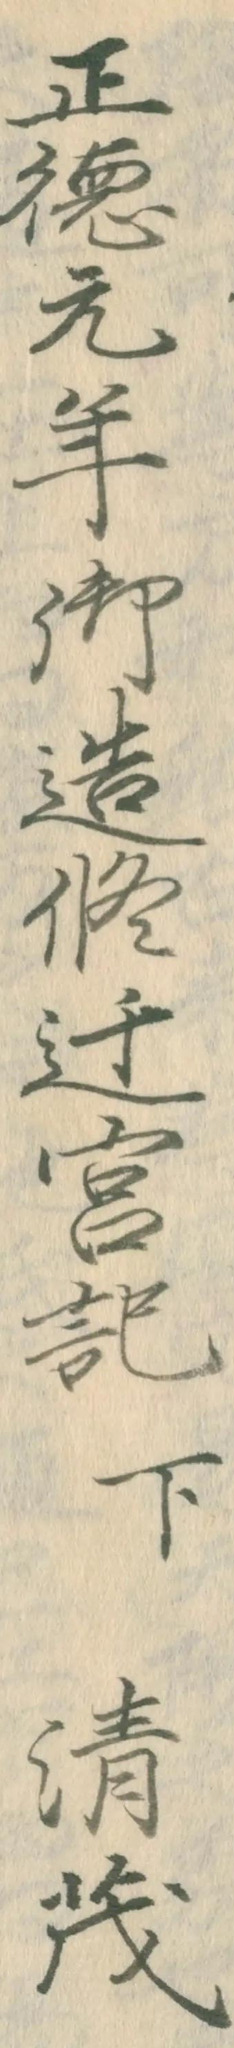正徳元年御造修迁宮記下清茂

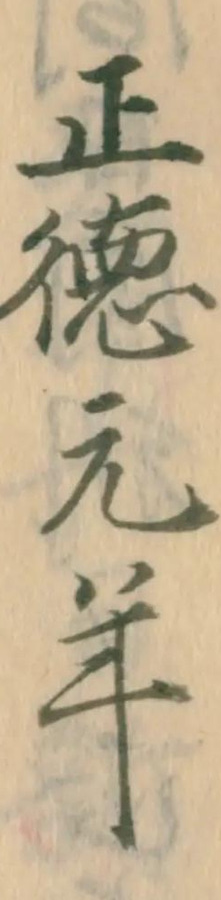正徳元年
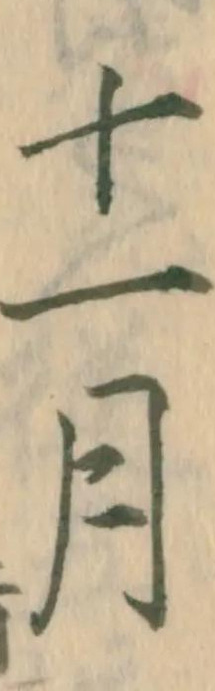十一月
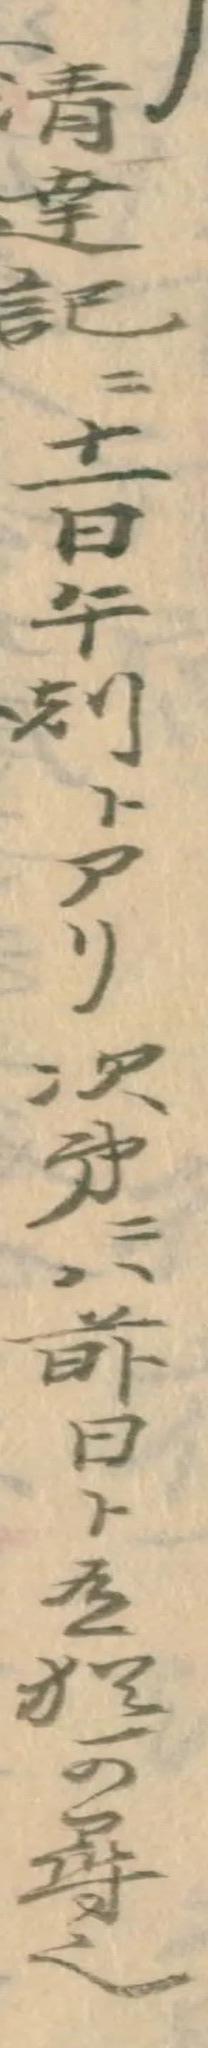(清達記ニ十一日午刻トアリ次第ニハ前日ト有猶可尋也

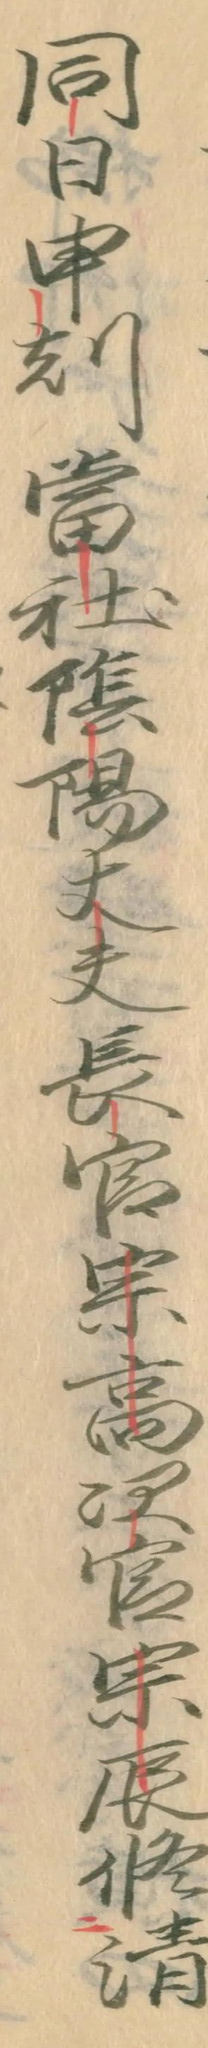同-日申_刻当-社陰-陽大-夫長-官宗高次-官宗辰修清
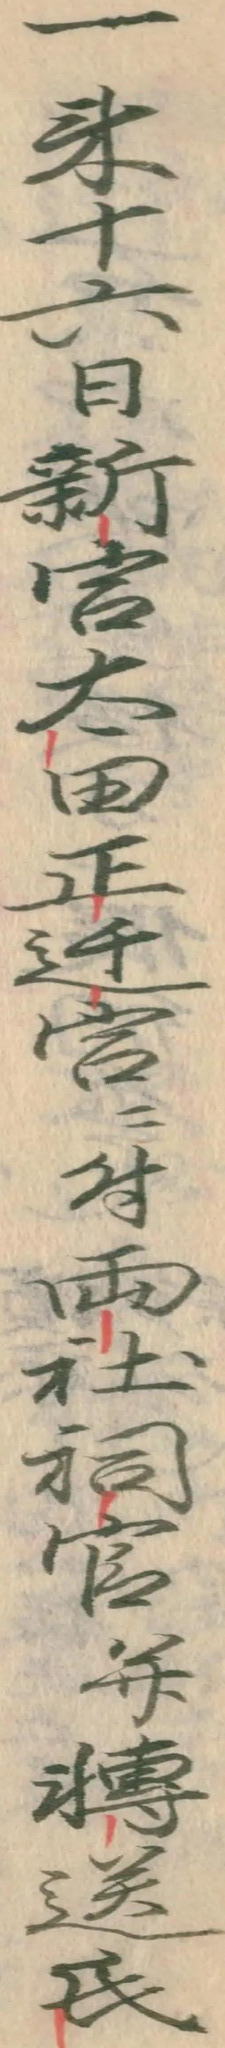一来十六日新-宮太_田正-迁-宮ニ付両-社祠-官并転-送氏_
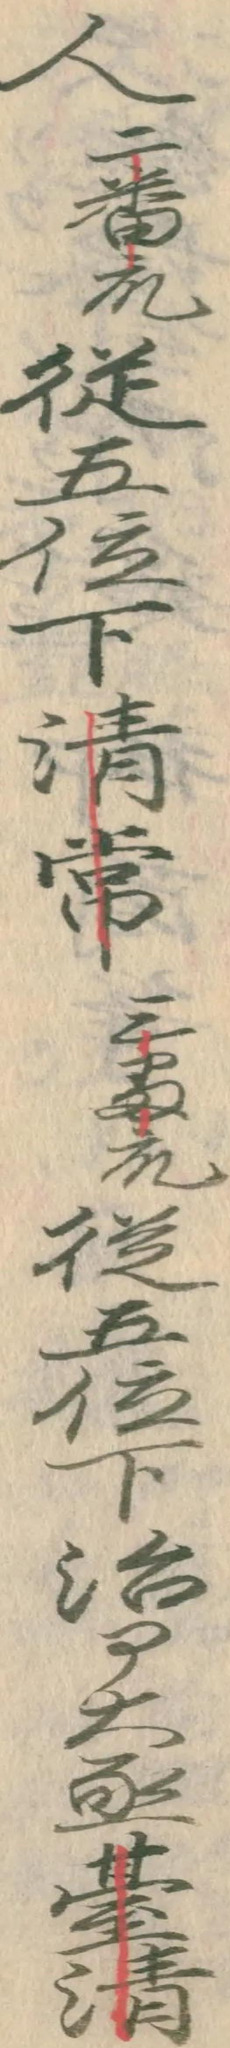人二-番-衆徒五位下清常三-番-衆従五位下治部大丞台清
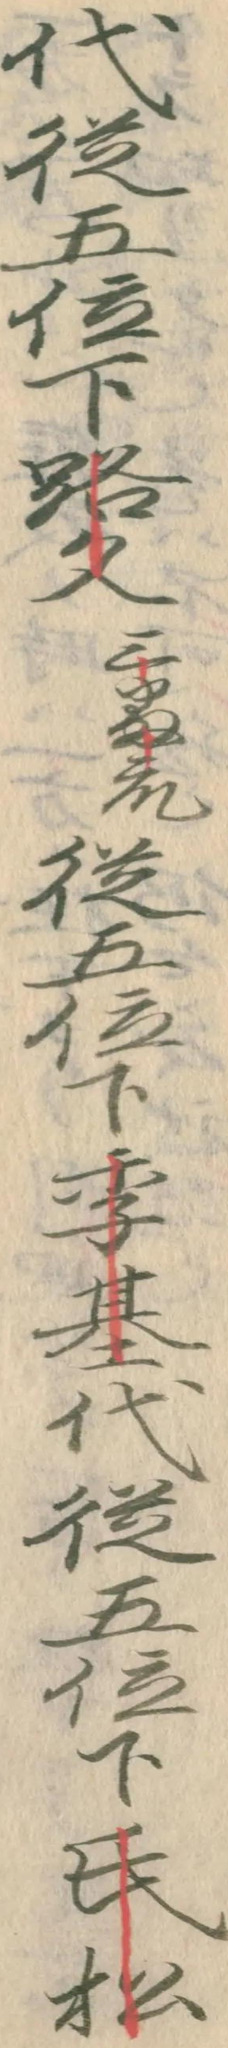代従五位下路久三-番-衆従五位下季基代従五位下氏松
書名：賀茂社記録. 第16冊
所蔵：国立国会図書館 National Diet Library, JAPAN
